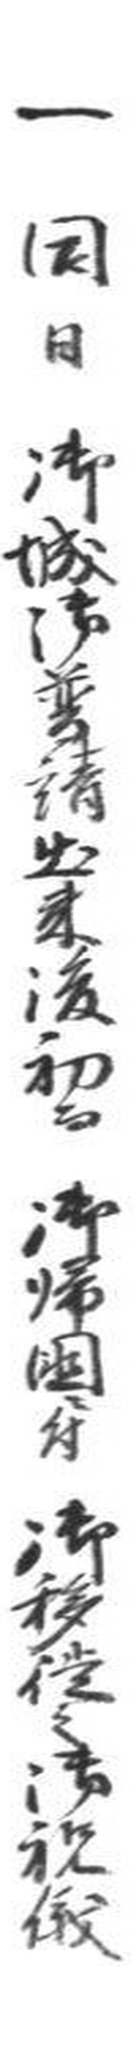一同日御城御普請出来後初而御帰国ニ付御移徙之御祝儀
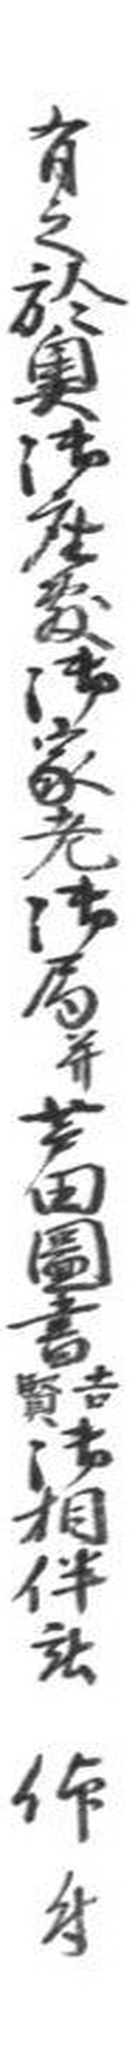有之於奥御座敷御家老御局并芦田図書吉賢御相伴被仰付
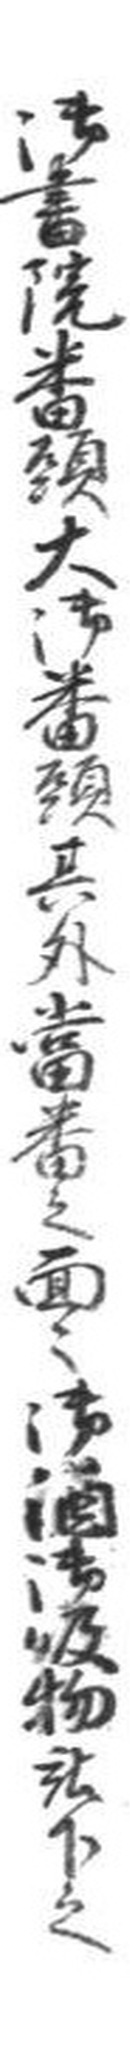御書院番頭大御番頭其外当番之面々御酒御吸物被下之
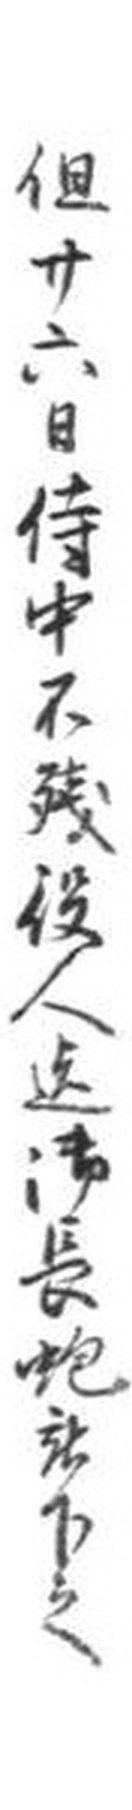但廿六日侍中不残役人迄御長蚫被下之
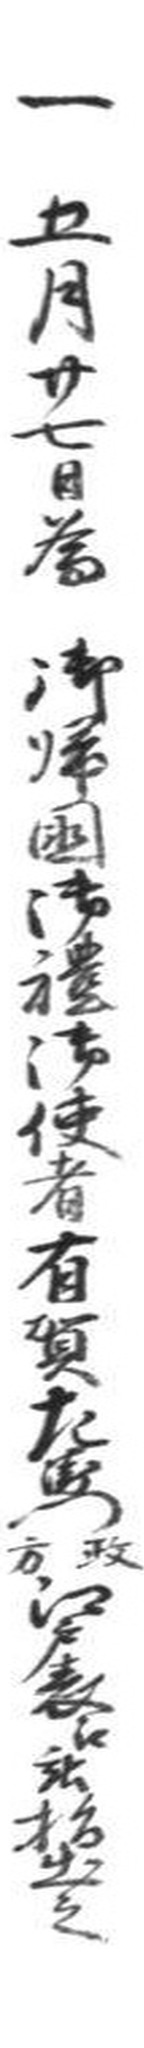一五月廿七日為御帰国御礼御使者有賀左衛門政方江戸表江被指出之
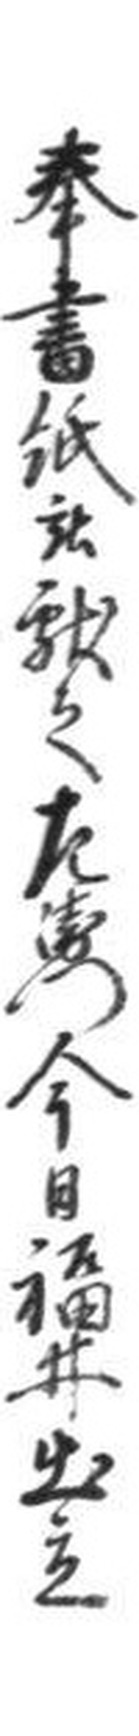奉書紙被献之左衛門今日福井出立
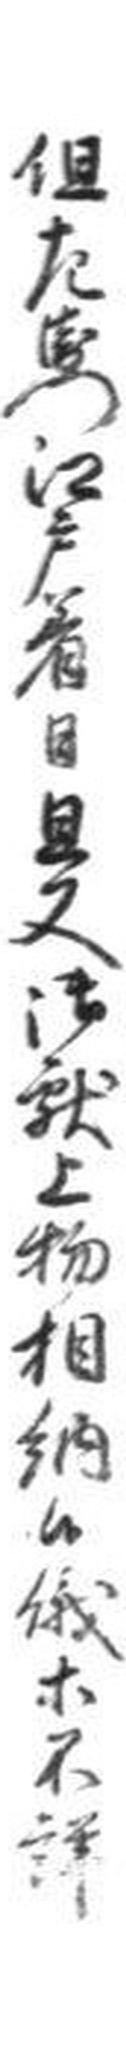但左衛門江戸着日且又御献上物相納候儀等不詳
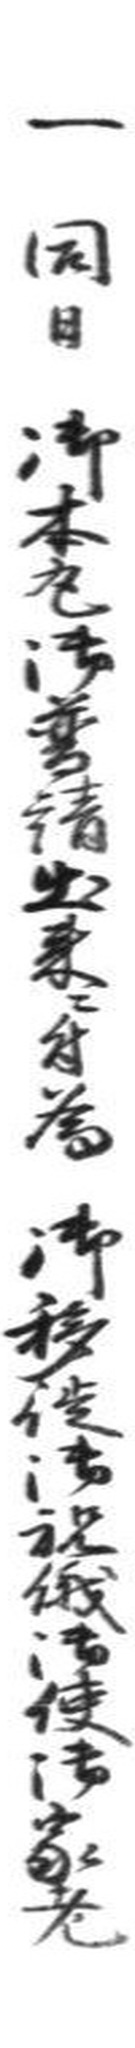一同日御本丸御普請出来ニ付為御移徙御祝儀御使御家老
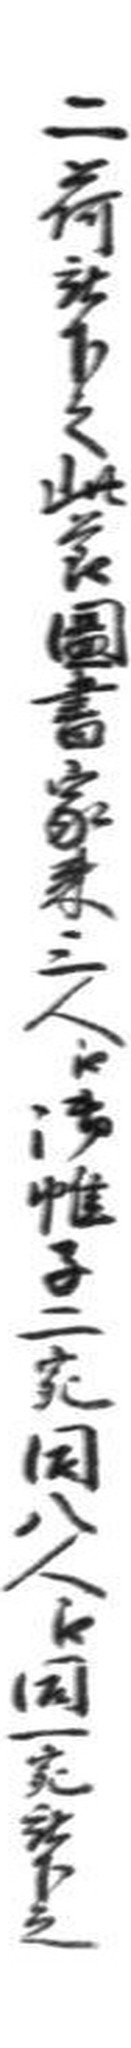二荷被下之此節図書家来三人江御帷子二宛同八人江同一宛被下之
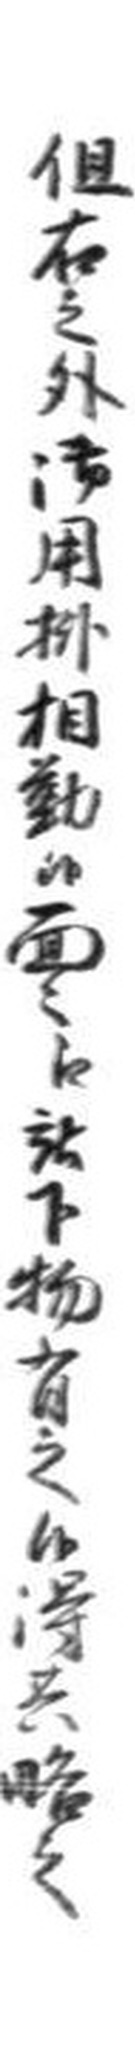但右之外御用掛相勤候面々江被下物有之候得共略之
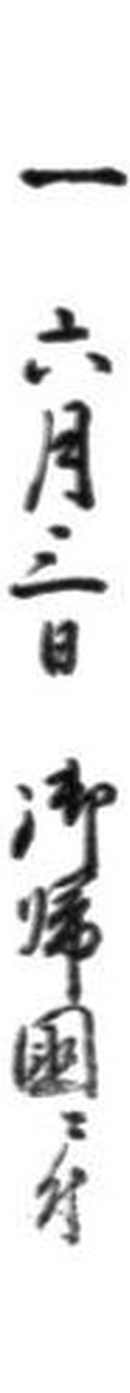一六月三日御帰国ニ付
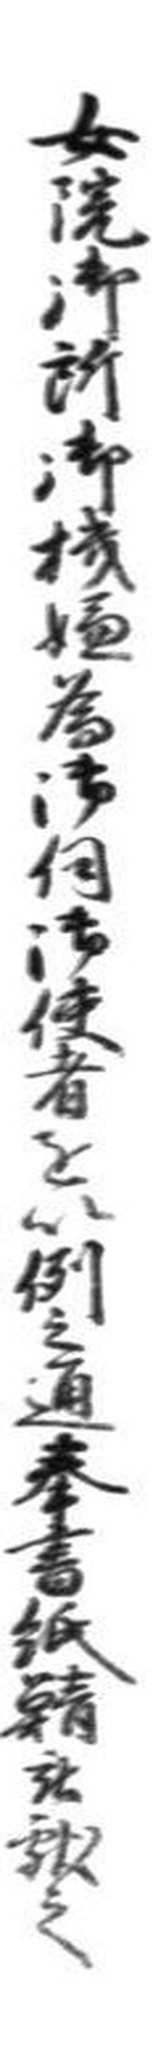女院御所御機嫌為御伺御使者を以例之通奉書紙鯖被献之
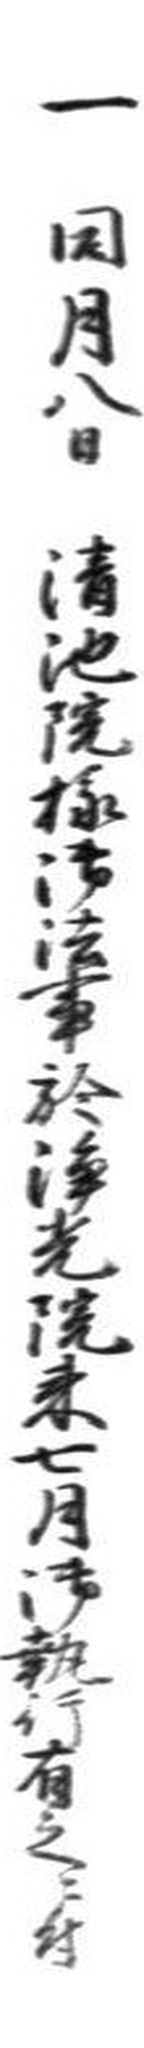一同月八日清池院様御法事於浄光院来七月御執行有之ニ付
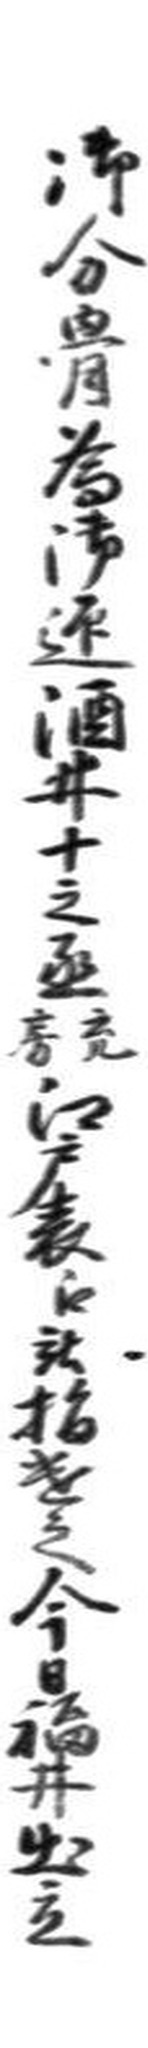御分骨為御迎酒井十之丞充房江戸表江被指遣之今日福井出立
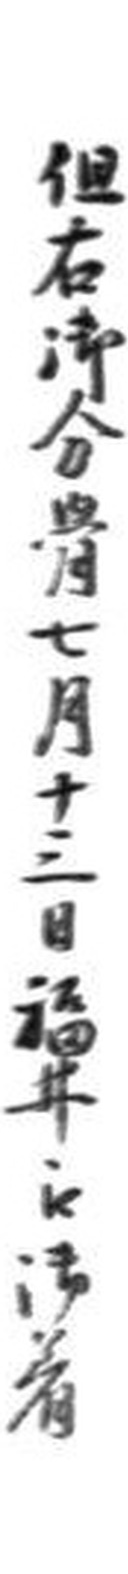但右御分骨七月十三日福井江御着

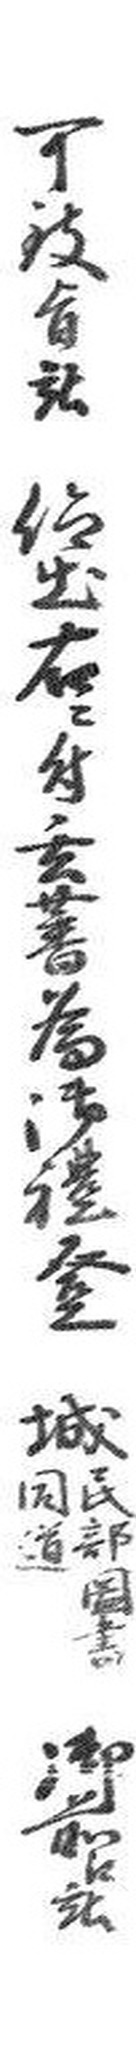可致旨被仰出右ニ付玄蕃為御礼登城民部図書同道御前江被
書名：家譜 八 光通公 従寛文十年到同十二年
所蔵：福井県文書館 Fukui Prefectural Archives
